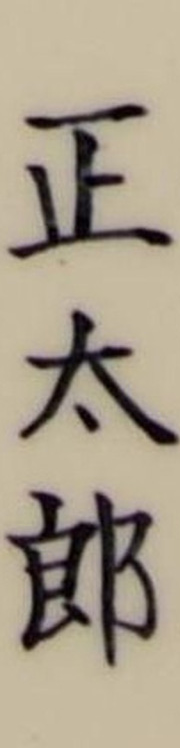正太郎
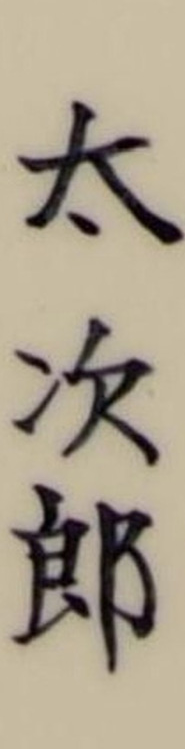太次郎
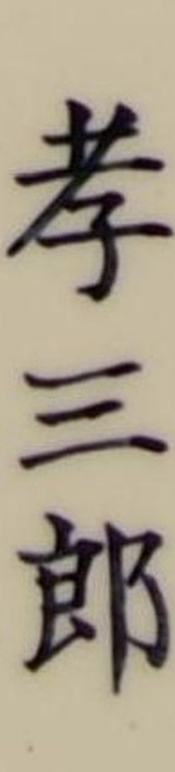孝三郎
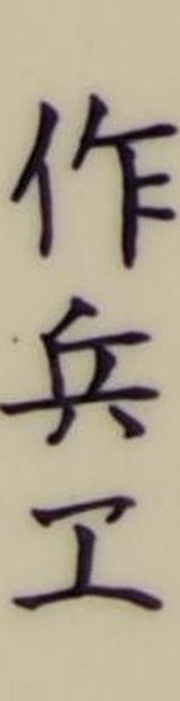作兵ヱ
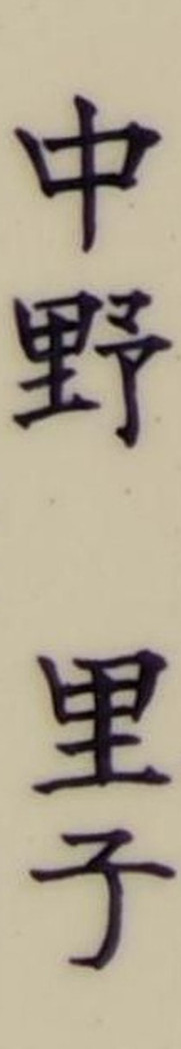中野里子
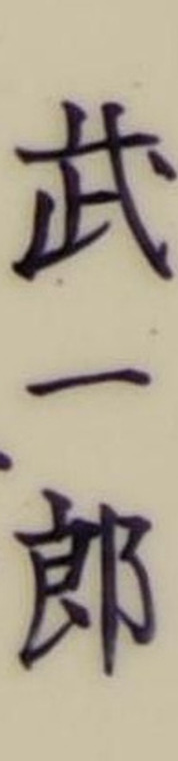武一郎

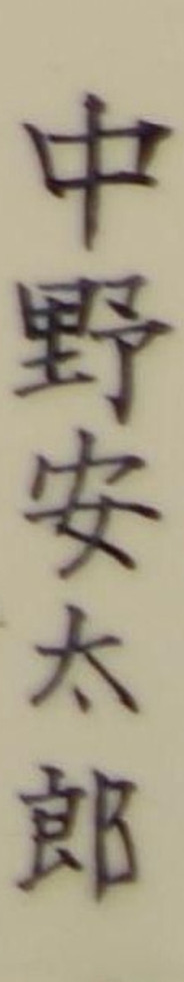中野安太郎
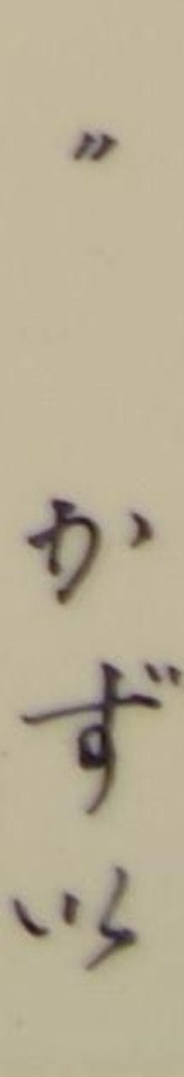かずい
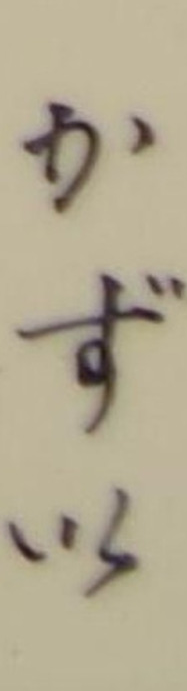かずい
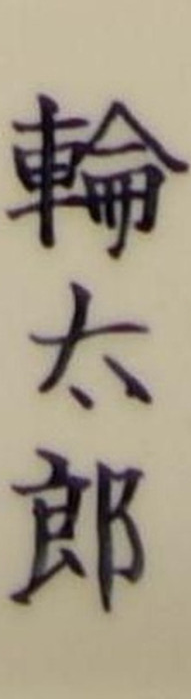輪太郎
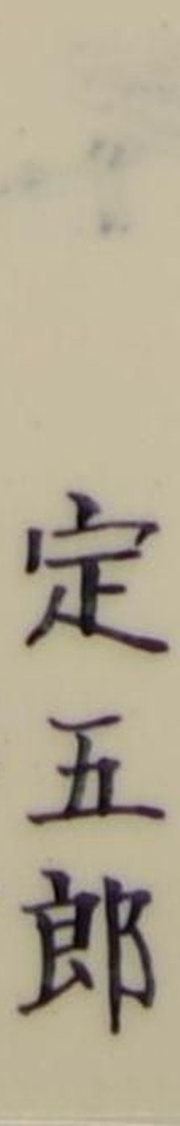定五郎
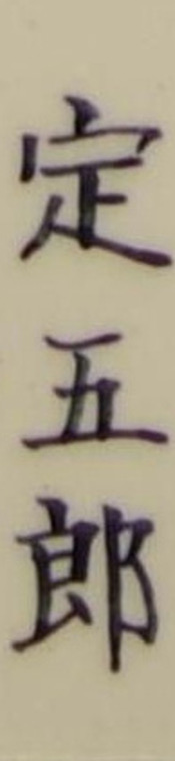定五郎
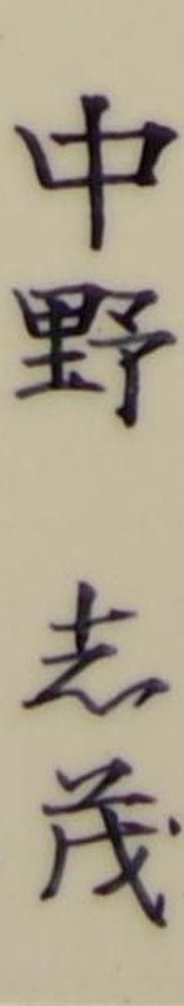中野志茂
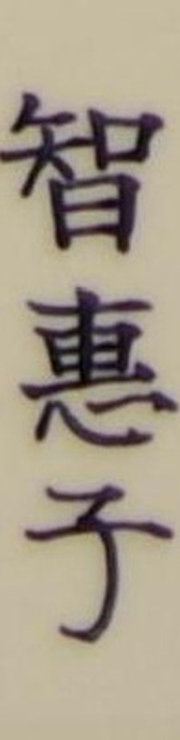智恵子
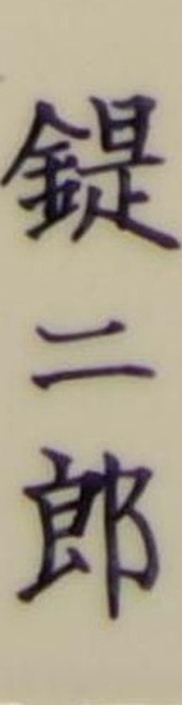鍉二郎
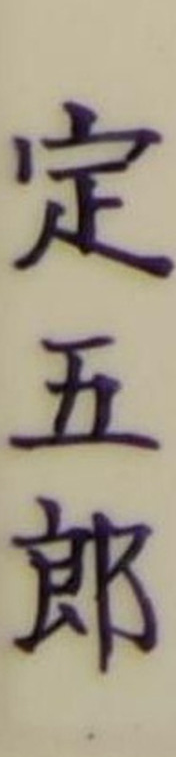定五郎
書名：A~D
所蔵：koyasan kongobuji
